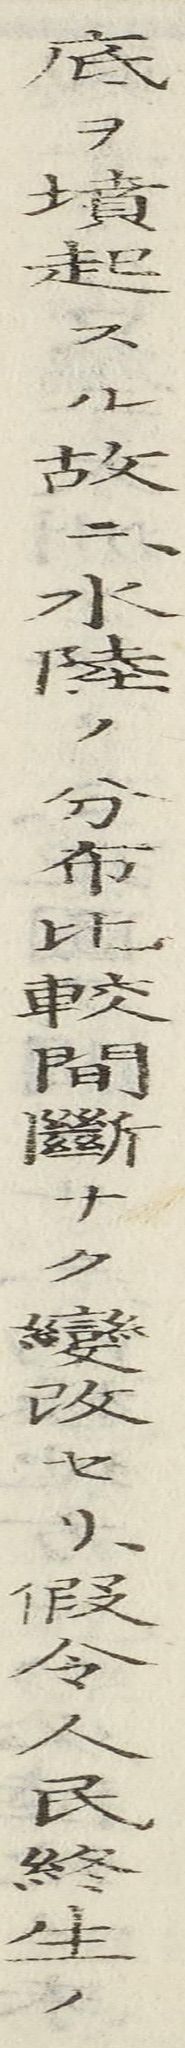底ヲ墳起スル故ニ、水陸ノ分布比較間断ナク変改セリ、仮令人民終生ノ
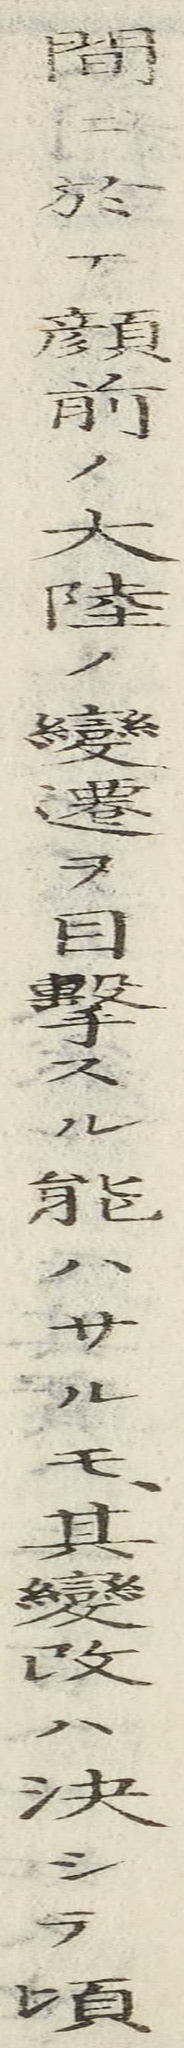間ニ於テ顔前ノ大陸ノ変遷ヲ目撃スル能ハサルモ、其変改ハ決シテ頃
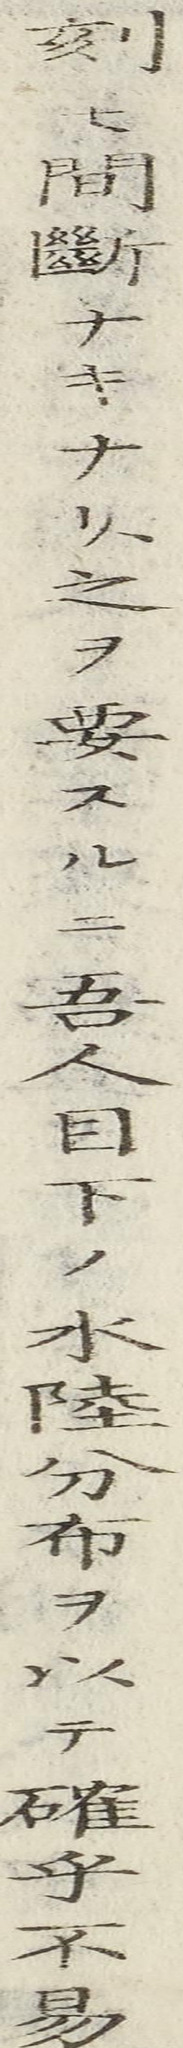刻モ間断ナキナリ、之ヲ要スルニ吾人目下ノ水陸分布ヲ以テ確乎不易
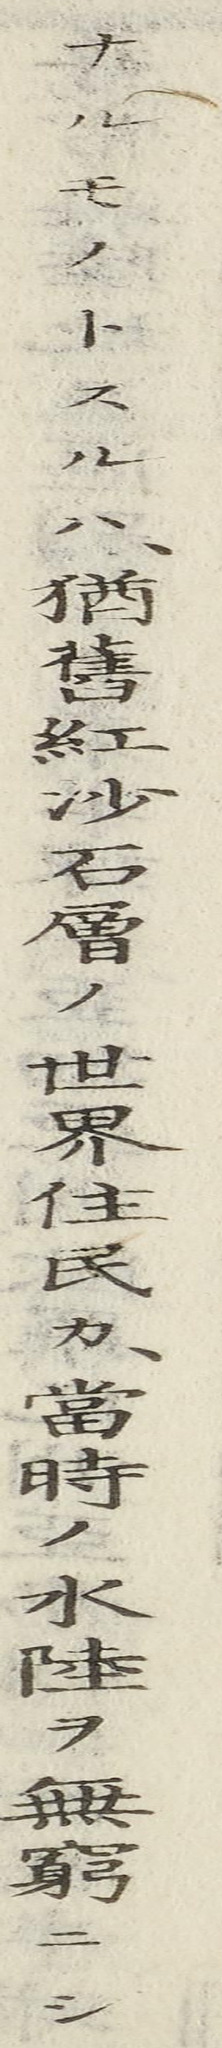ナルモノトスルハ、猶旧紅沙石層ノ世界住民カ、当時ノ水陸ヲ無窮ニシ
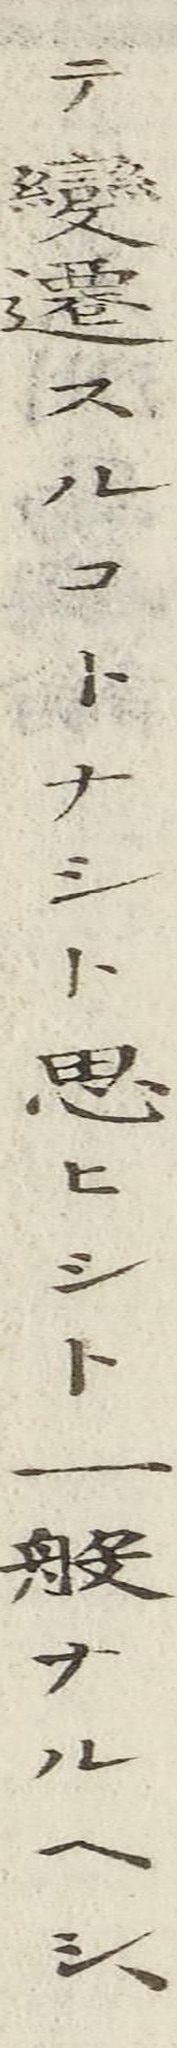テ変遷スルコトナシト思ヒシト一般ナルヘシ、

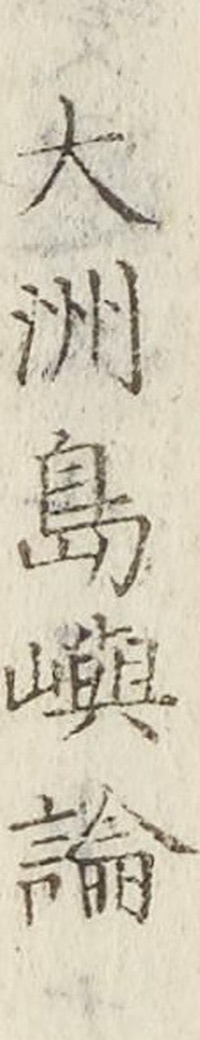大洲島嶼論
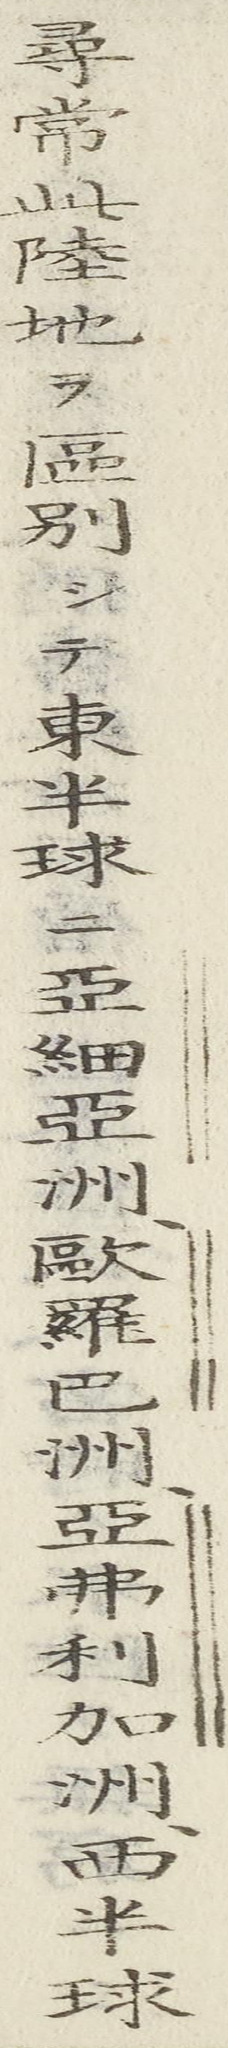尋常此陸地ヲ区別シテ東半球ニ亜細亜洲、欧羅巴洲、阿弗利加洲、西半球
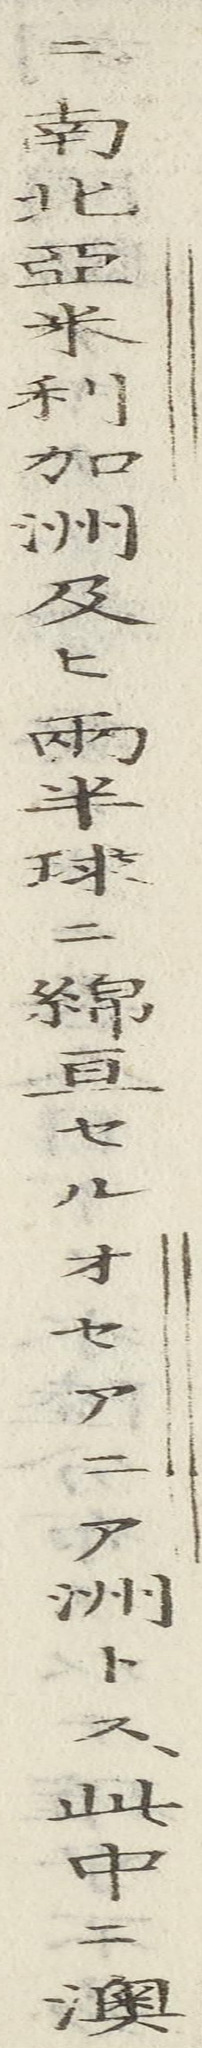ニ南北亜米利加洲及ヒ両半球ニ綿亘セルオセアニア洲トス、此中ニ濠
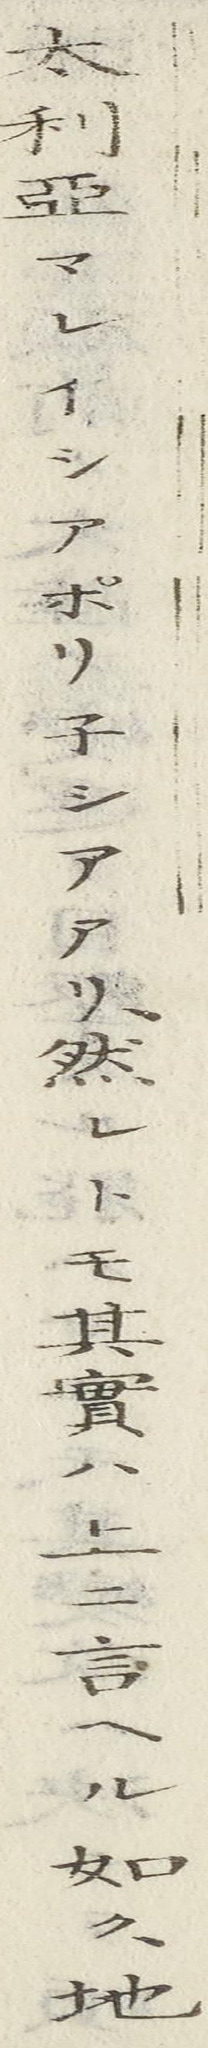太利亜マレイシアポリネシアアリ、然レトモ其実ハ上ニ言ヘル如ク、地
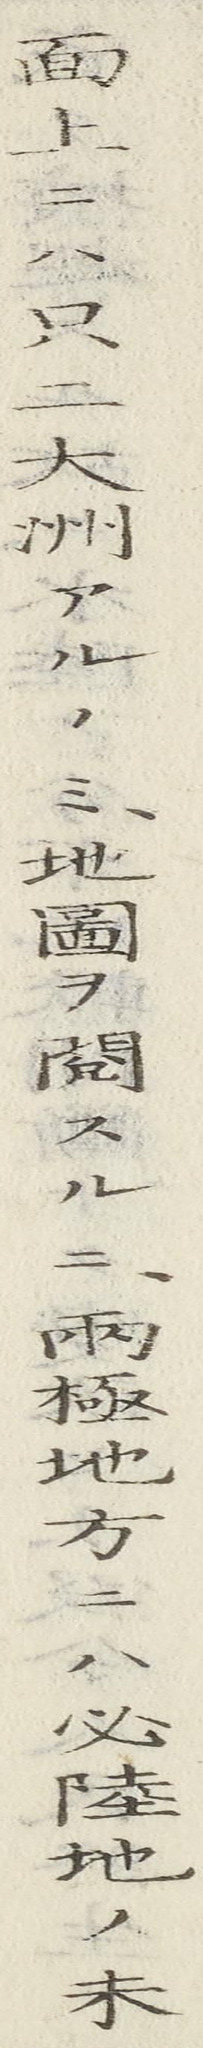面上ニハ只二大集洲アルノミ、地図ヲ閲スルニ、両極地方ニハ必陸地ノ未
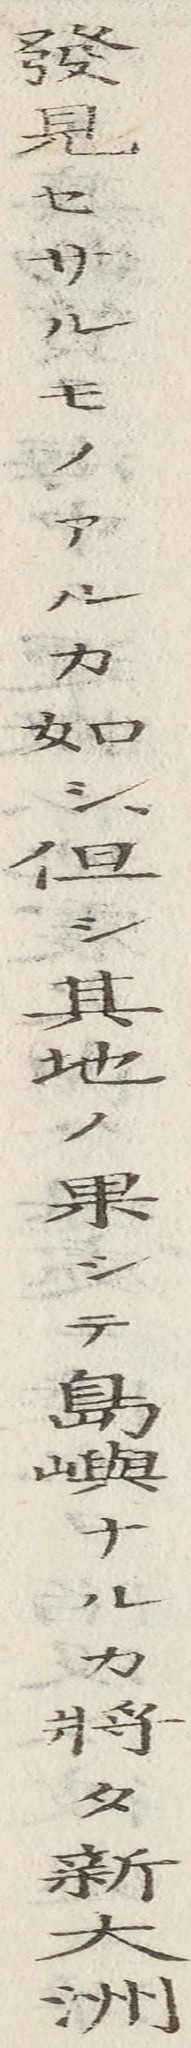発見セサルモノアルカ如シ、但シ其地ノ果シテ島嶼ナルカ将タ新大洲
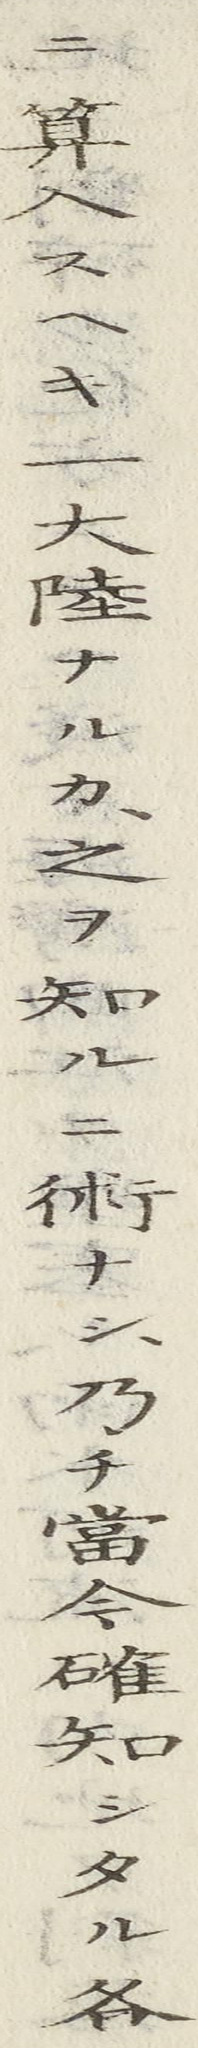ニ算入スヘキ一大陸ナルカ、之ヲ知ルニ術ナシ、乃チ当今確知シタル各
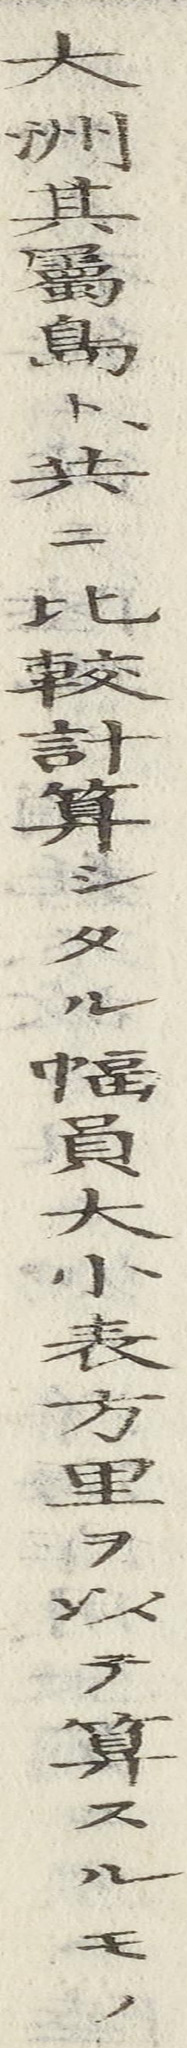大洲其屬島ト、共ニ此比較計算シタル幅員大小表方里ヲ以テ算スルモノ
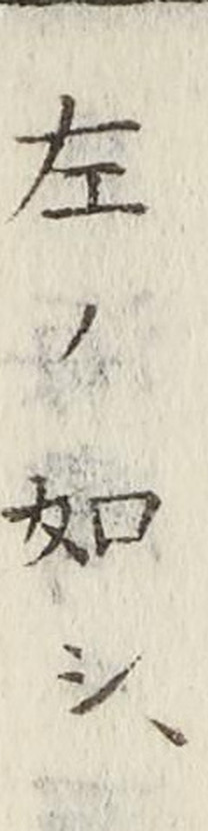左ノ如シ、
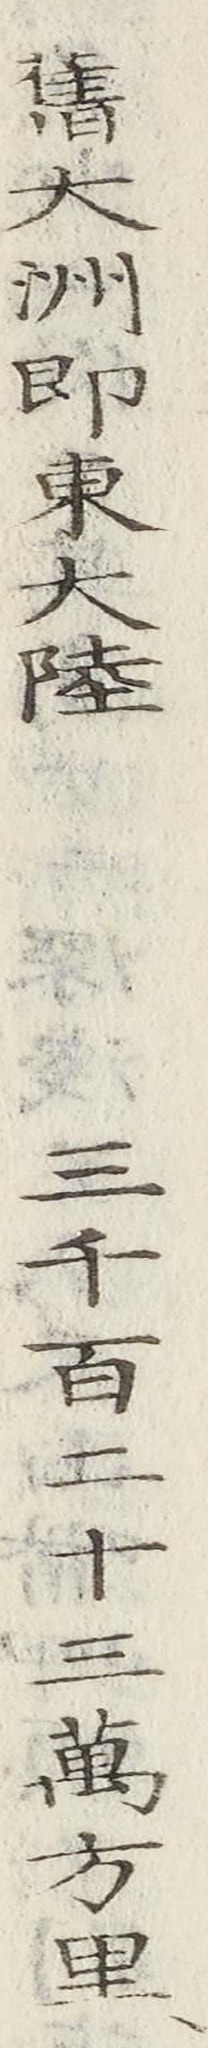旧大洲即東大陸三千百二十三万方里、
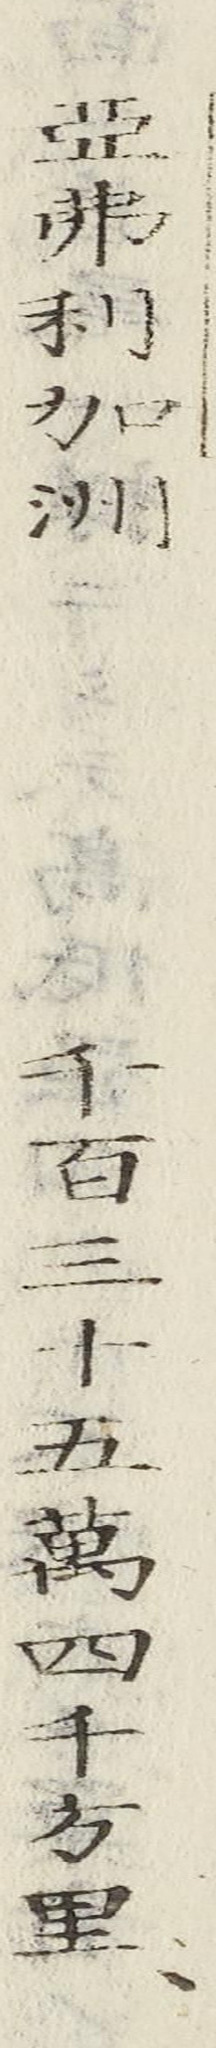阿弗利加洲千百三十五万四千方里、
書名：百科全書　地文學　全
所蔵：東京大学地震研究所図書室 Earthquake Research Institute Library, The University of Tokyo, JAPAN
